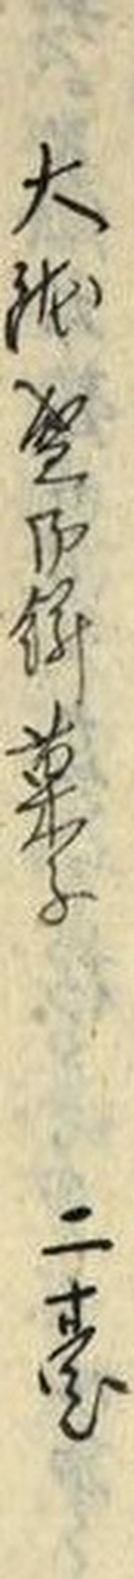大鉢盛御餅菓子二台

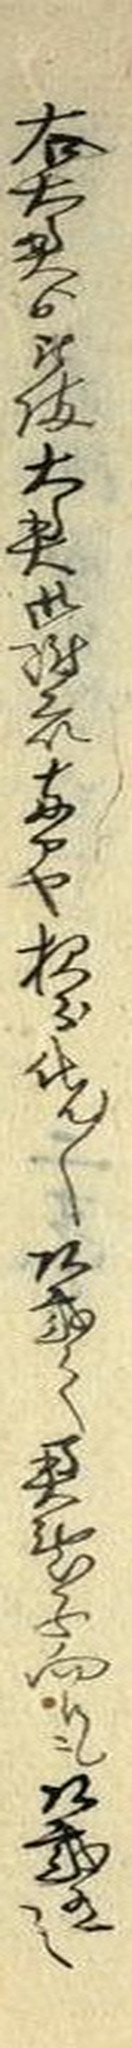右大奥ゟ被備大奥御附衆両部や夜分代ル〳〵頂戴之奥台子向江も頂戴有之
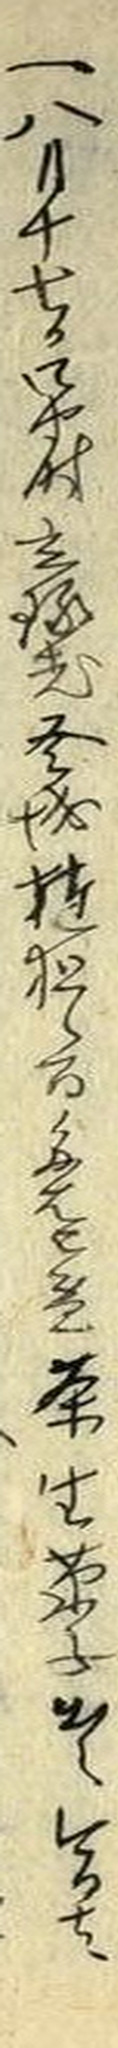一八月十七日四半時玄琢老登城韃靼之間たばこ盆茶生菓子出之今日者
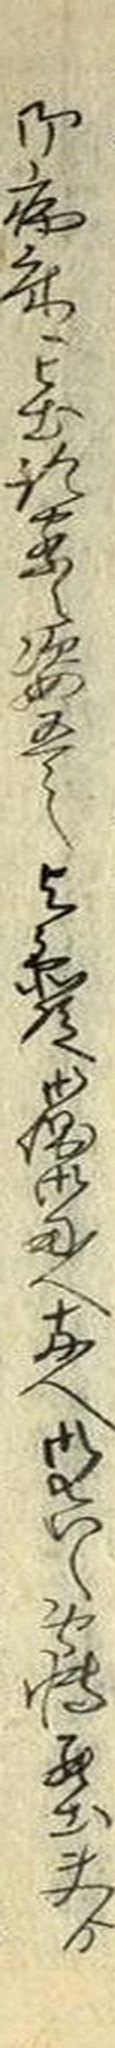御病床へ被診察之姿有之姿有之与兵衛殿御側御用人両人御匕いし専博罷出夫ゟ
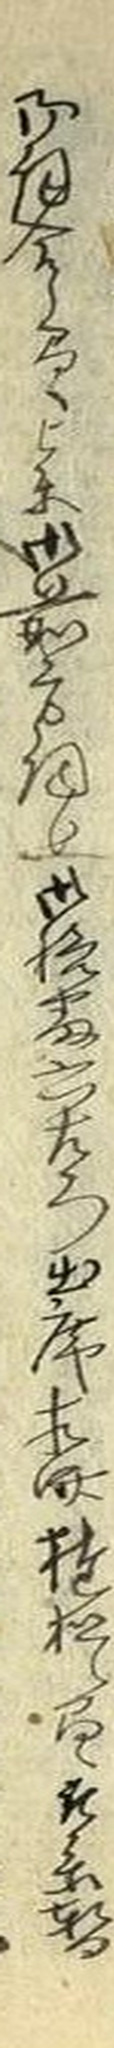御調合之間へ被参御前方調上御膳番六右衛門出席相済韃靼之間へ被参暫
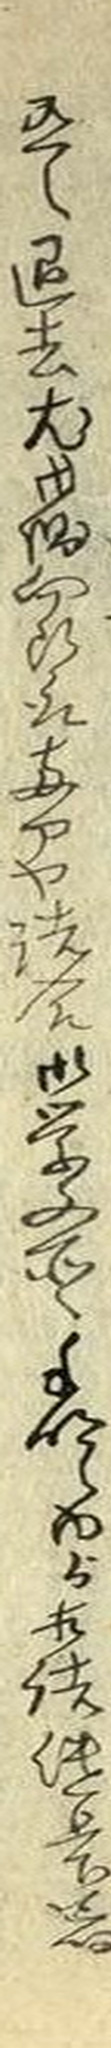有之退去尤御側向頭取両部や詰合御学文所へ手明之内ゟ相詰継上下着
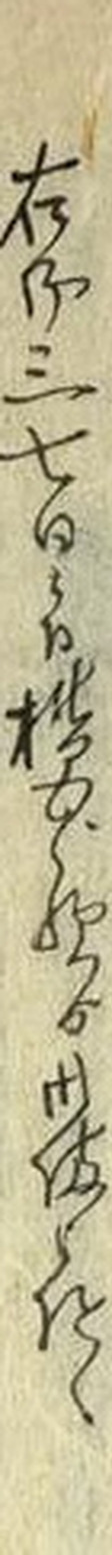右御三七日ニ付楷五郎様ゟ御備被遊候
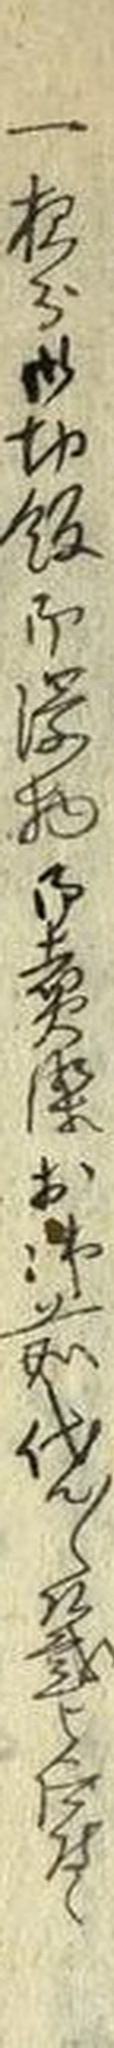一夜分御切飯御浸物御煮染於御前代ル〳〵頂戴被仰付候
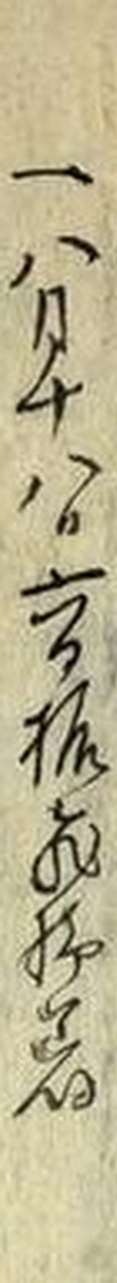一八月十八日六日振飛脚着
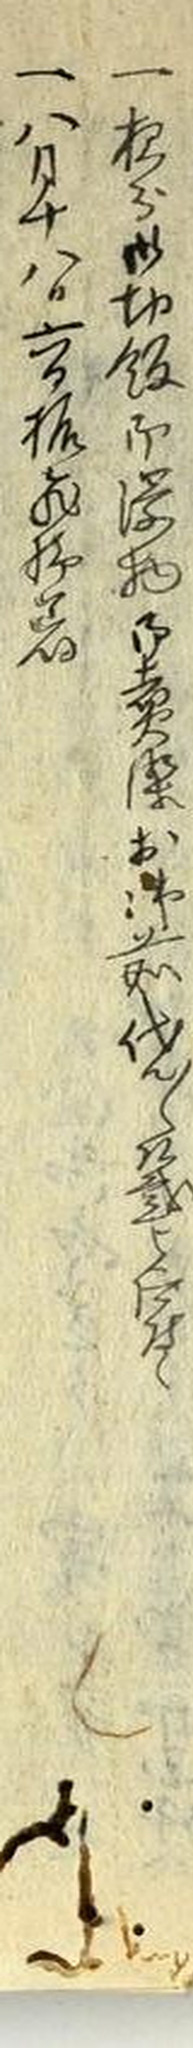一八月十八日六日振飛脚着
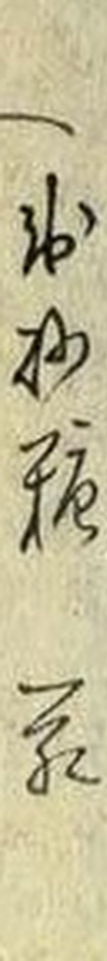氷砂糖一箱
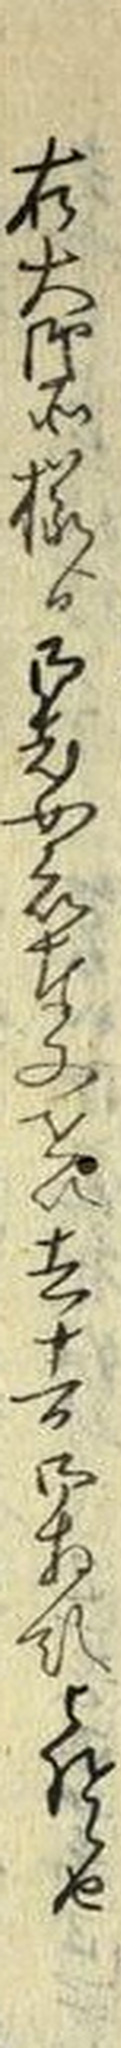右大御所様ゟ御老女衆奉文を以去十一日御拝領被遊候由
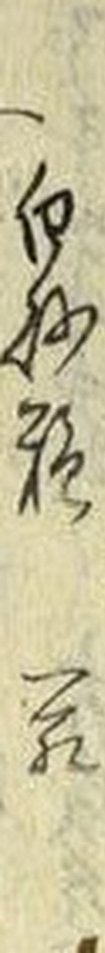白砂糖一箱
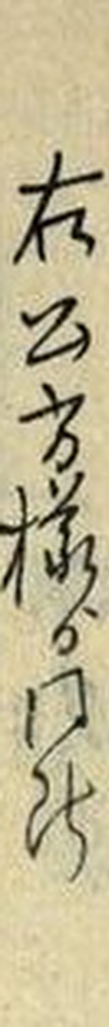右公方様ゟ同断
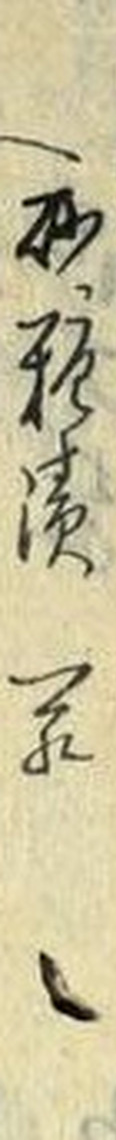砂糖漬一箱
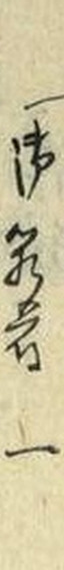御箱肴一
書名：少傅日録抄（斉善付側向頭取日記、江戸并道中、初入在国、逝去後…
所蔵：福井県文書館 Fukui Prefectural Archives
